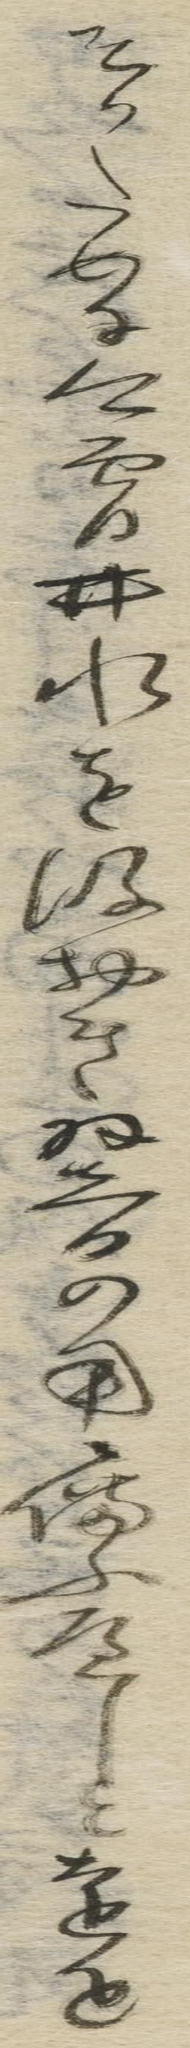そかために今宵井水を汲おき翌日の用に備ふへしと遠近
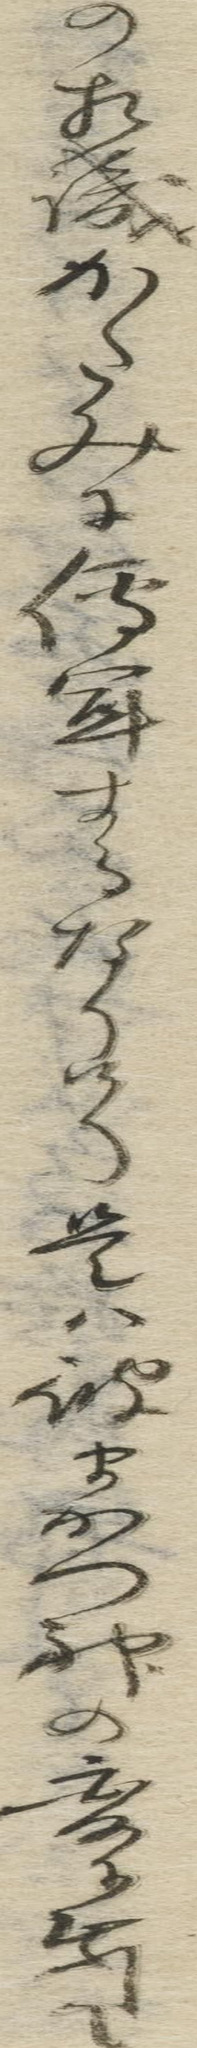の相識かたみに伝聞するなりけり是ハ彼まかつ神の変に乗して
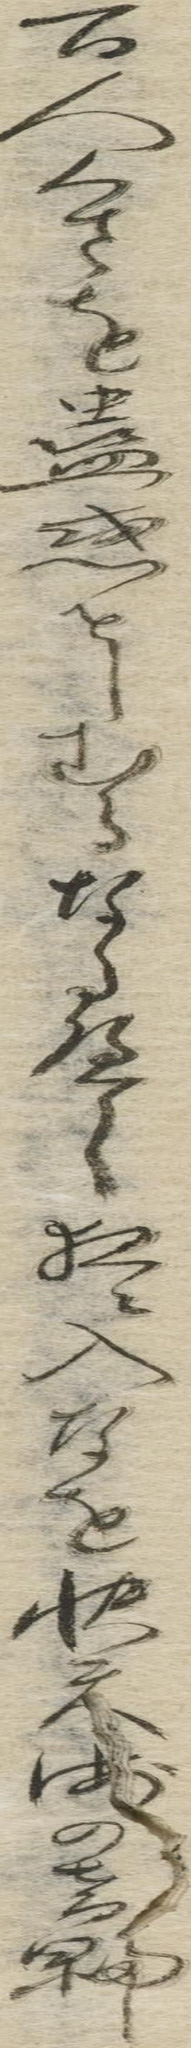百人くさ？を蠱惑をしむるなるへし夜二入なを快天海の音夥し
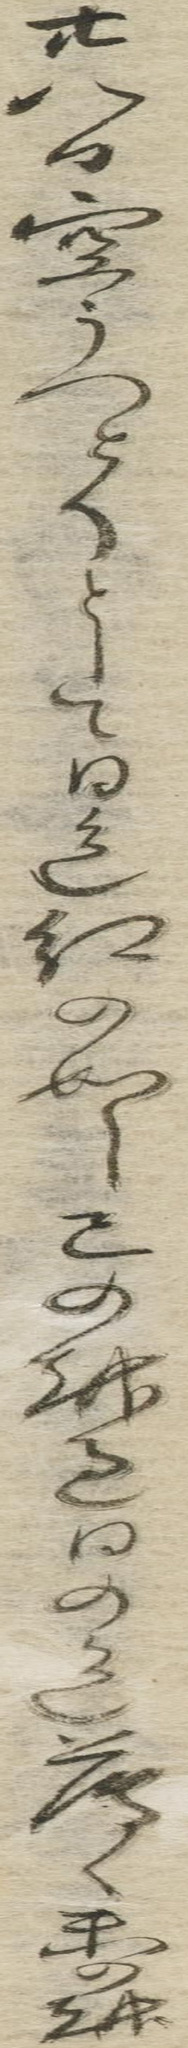廿八日空うつとりとして日色紅の如し巳の刻過日の色薄く未の刻
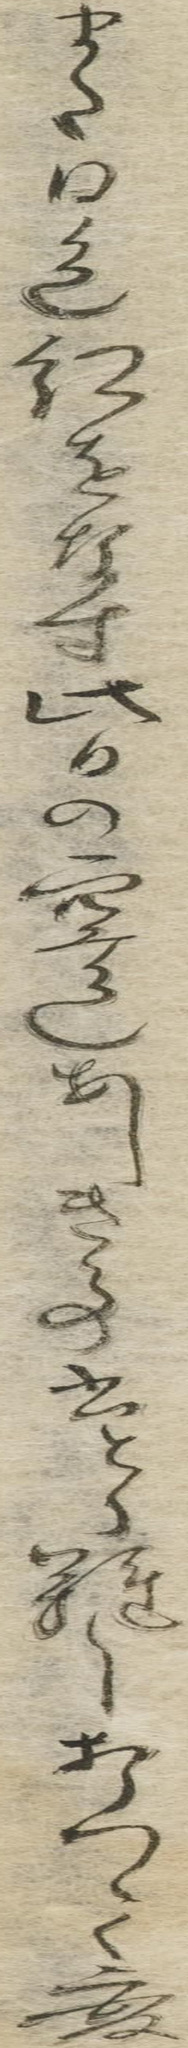また日色紅をなす此日の空色あしき事書とり難し打つゝく変
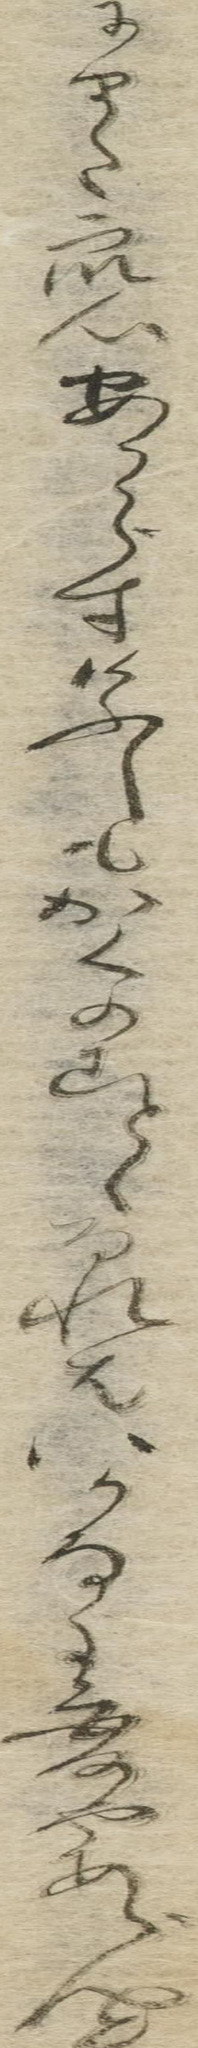にまた衆心あたらすけふしもかくのことくなれはいかなる変やあらんと
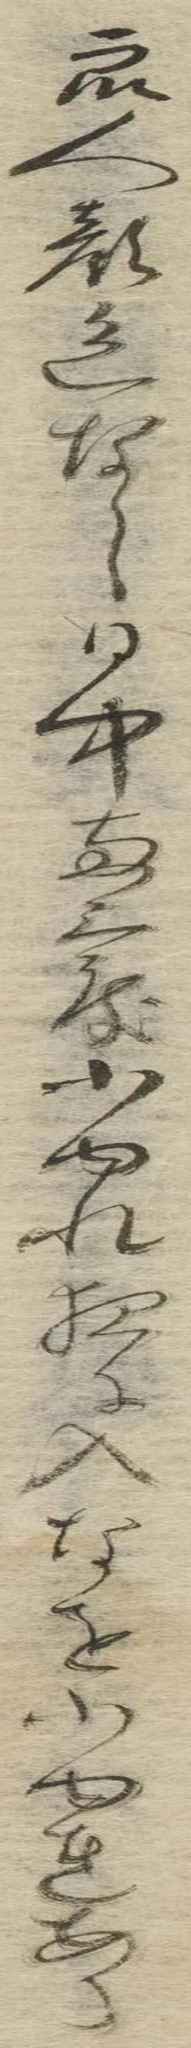衆人顔色なし日中両三度小ゆれ夜に入なを小ゆれあり

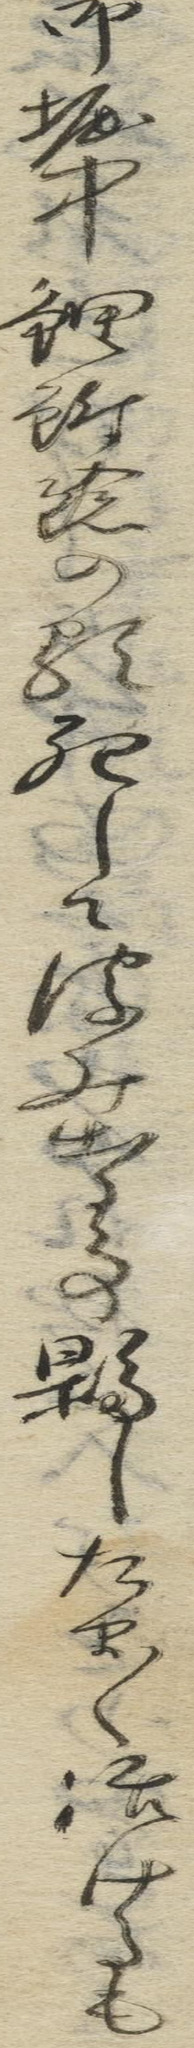御堀中鯉鮒鯰の類死して沈み出る事夥したま〳〵活けるも
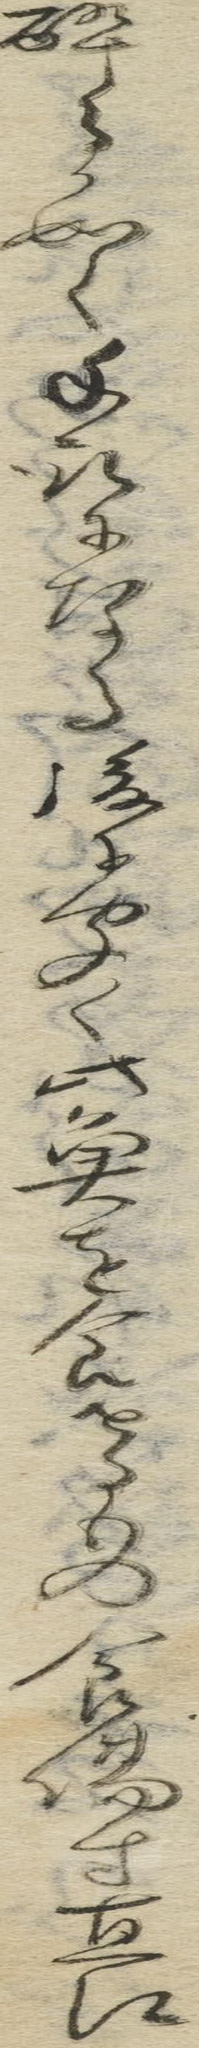砕るか如く手取になる後に聞く此魚を食をるもの食痛す直江
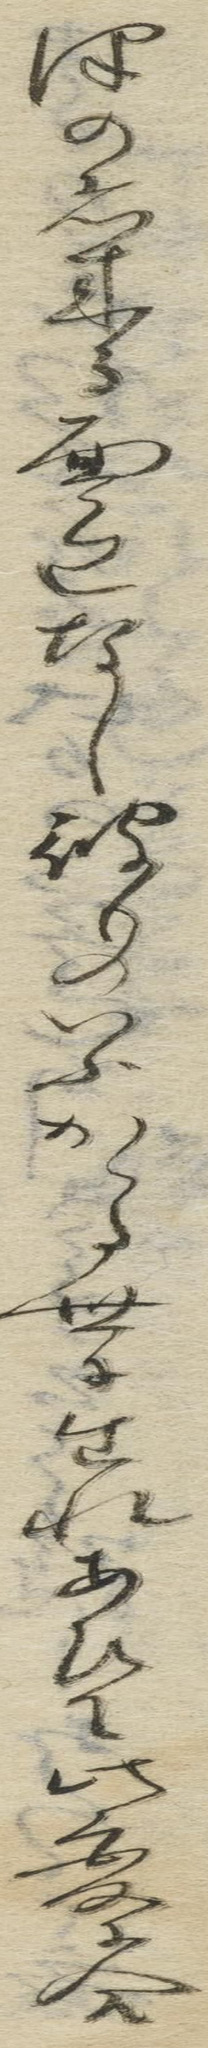津の者と来る面色なし彼ものいふかゝる世に生れあひて此の変に合
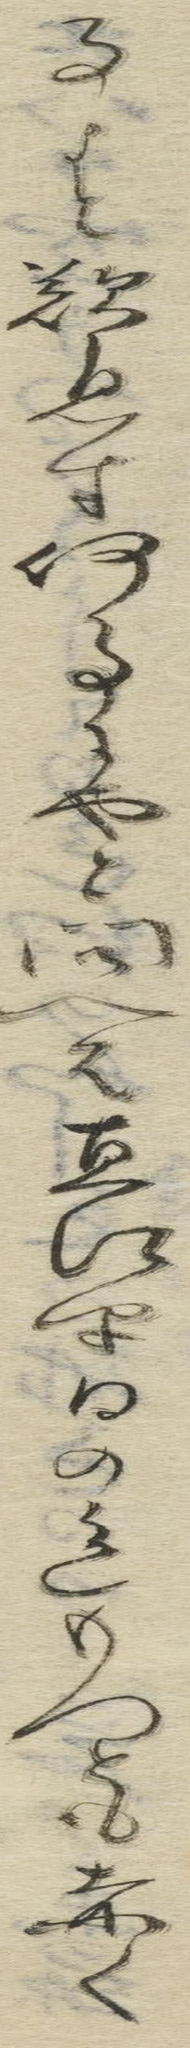るにと歎息す何事にやと問へは直江津日の色もつとも赤く
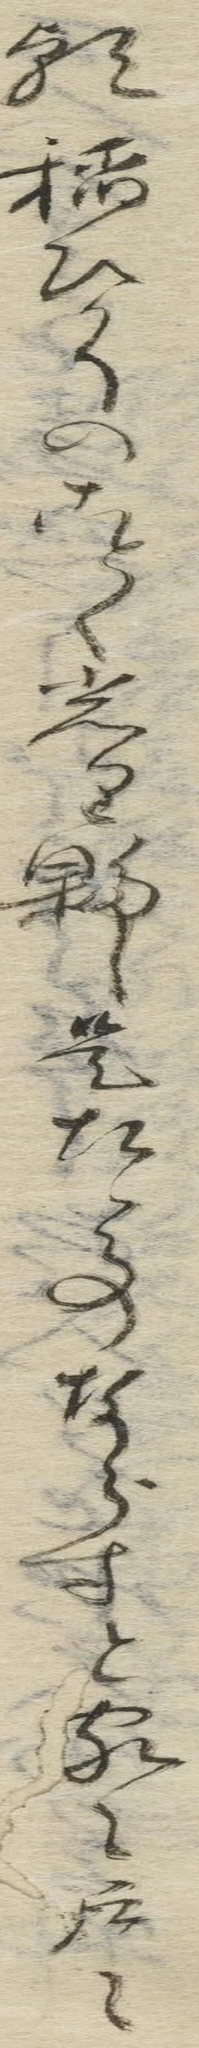朝稲ひかりのことく光り夥し是たゝ事ならすと家々戸々
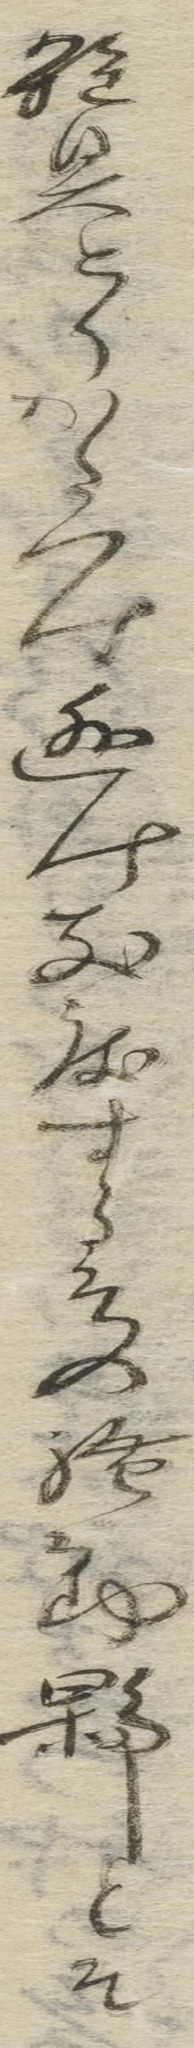雑具とりかたつけ逃け支度するその騒動夥しとそ
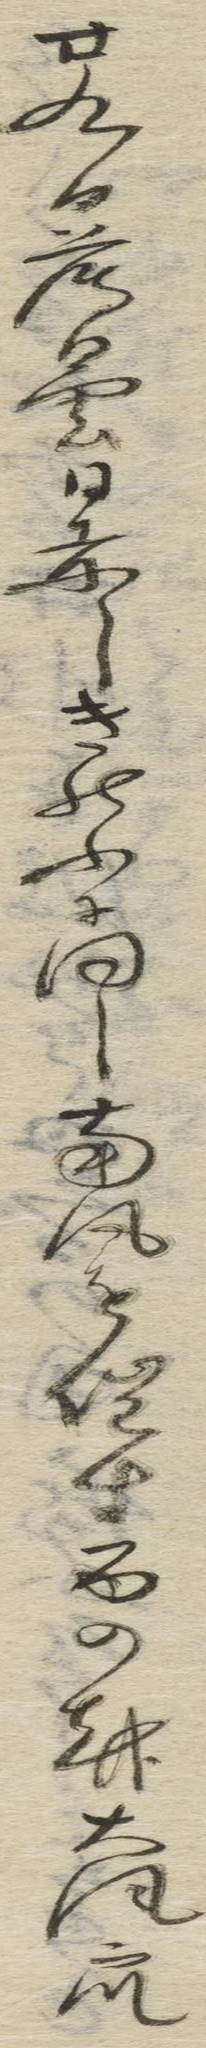廿九日薄曇日恋しきのふに同し南風を催す酉の刻大風衆
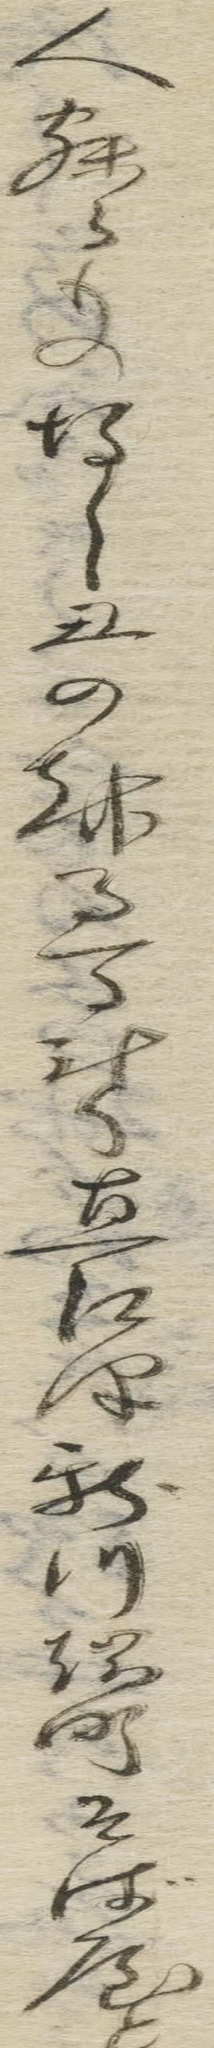人寐るものなし丑の刻過る計り直江津新川端町そば屋と
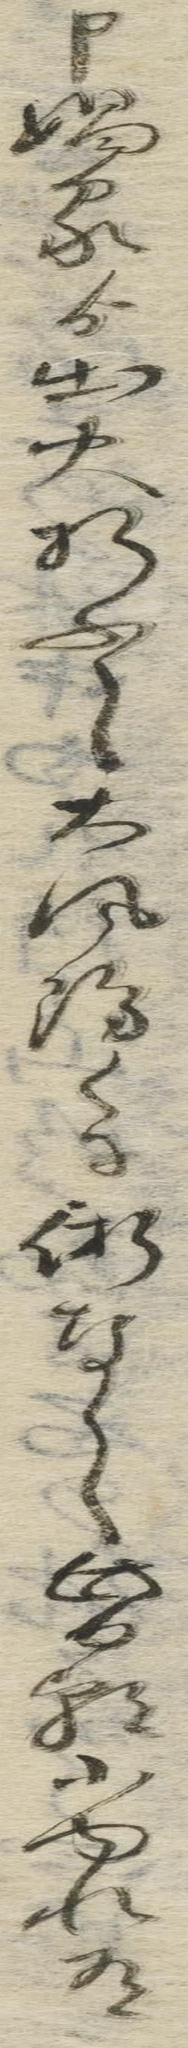申娼家ゟ出火折ふし大風防くに術なし此日朝小ゆれ有
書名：弘化丁未天變日記
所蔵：東京大学地震研究所図書室 Earthquake Research Institute Library, The University of Tokyo, JAPAN
